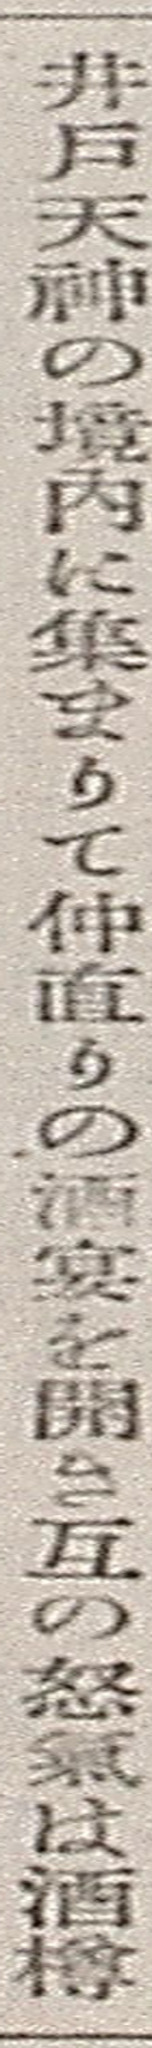井戸天神の境内に集まりて仲直りの酒宴を開き互の怒気は酒樽
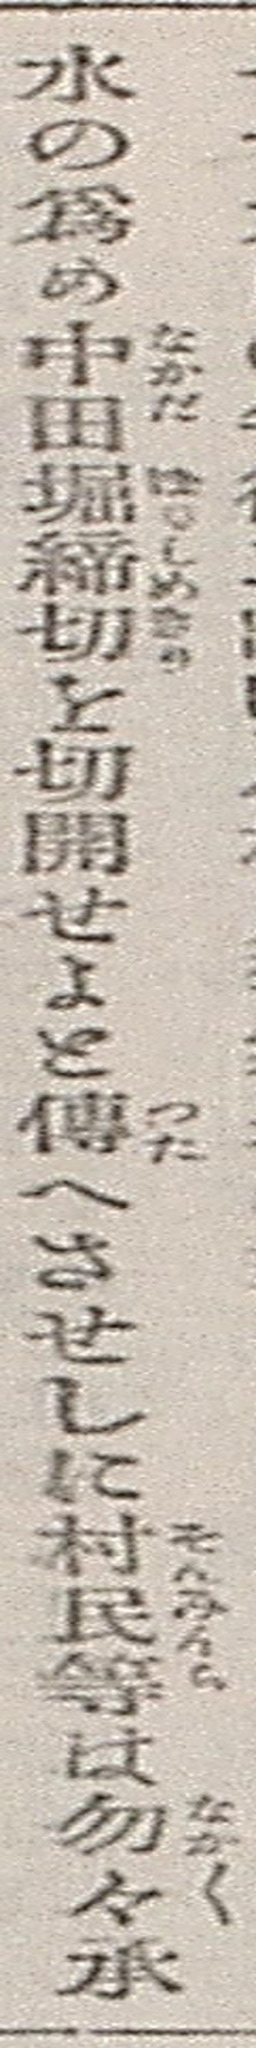水の為め中田堀締切を切開せよと伝へさしに村民等は勿々承
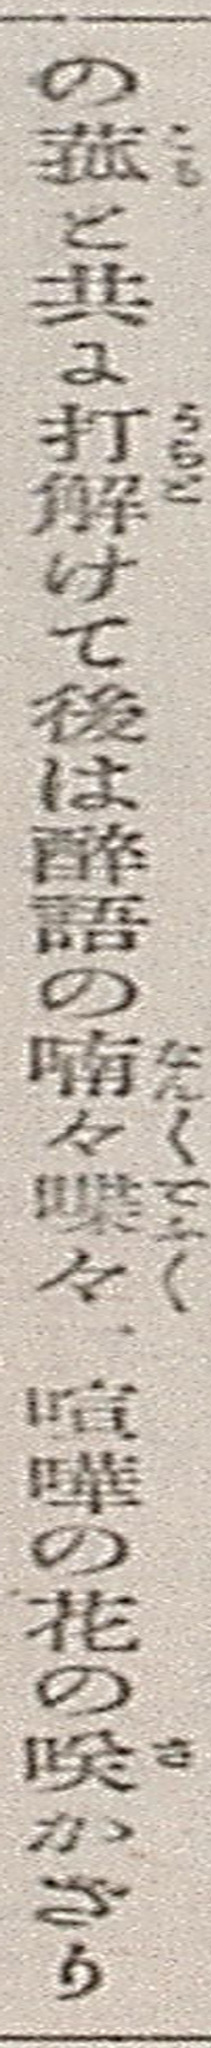の菰と共に打解けて後は酔語の喃々喋々一喧嘩の花の咲かざり
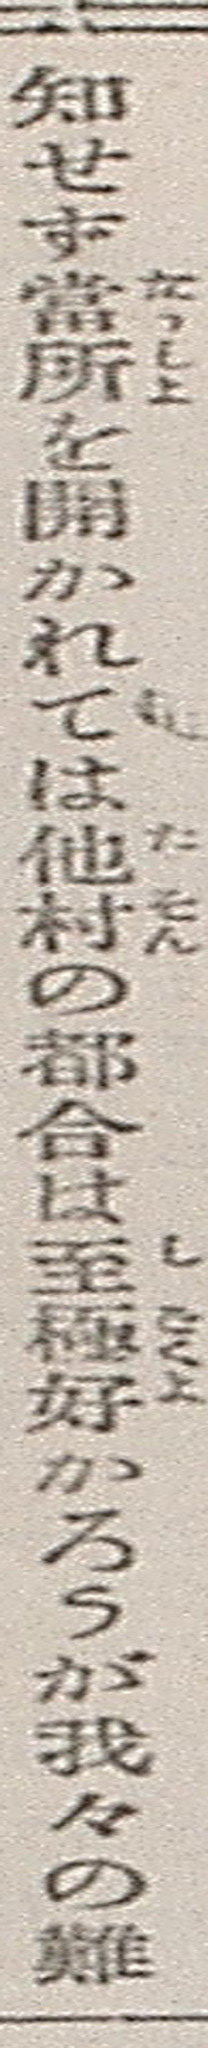知せず当所を開かれては他村の都合は至極好かろうが我々の難
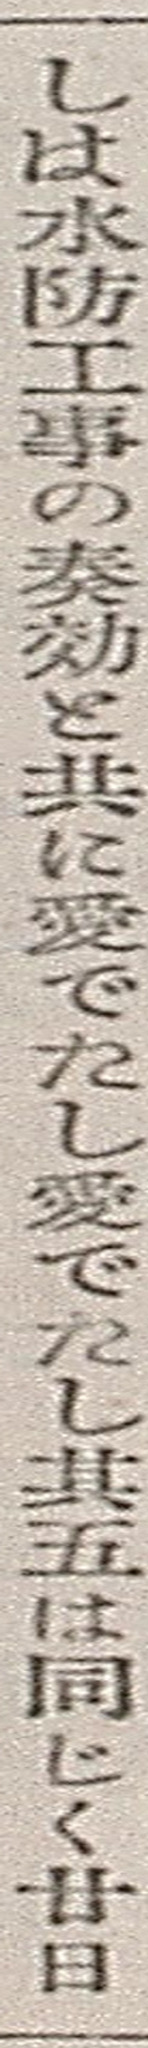しは水防工事の奏効と共に愛でたし愛でたし其五は同じく廿日
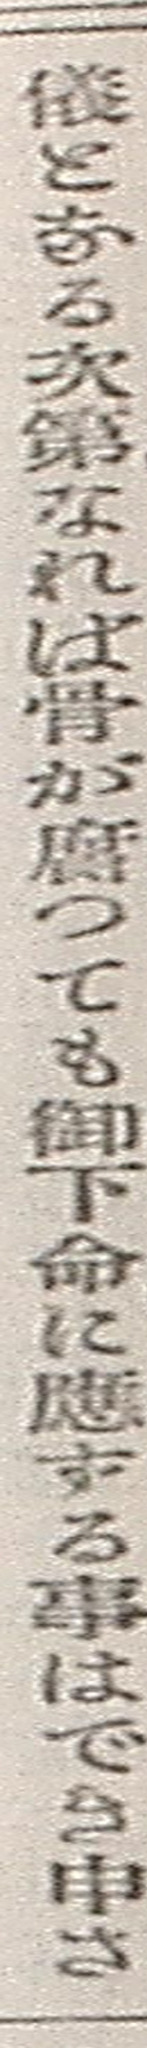儀となる次第なれば骨が腐つても御下命に応ずる事はでき申さ
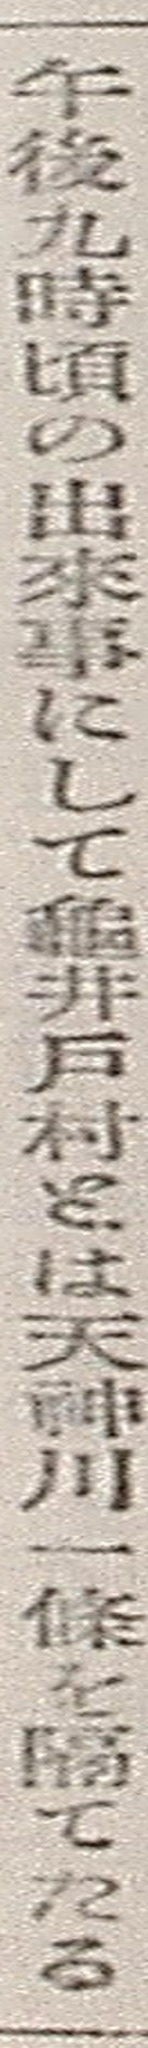午後九時頃の出来事にして亀井戸村とは天神川一条を隔てたる
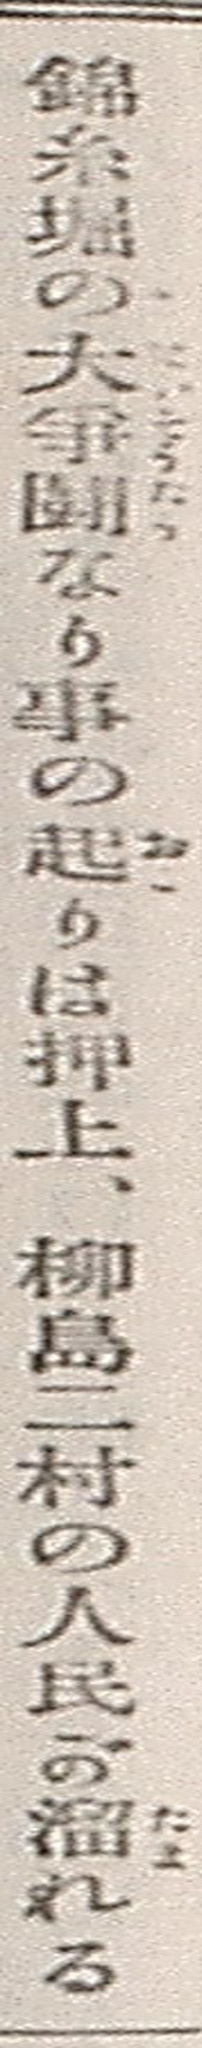錦糸堀の大争闘なり事の起りは押上、柳島ニ村の人民が溜れる
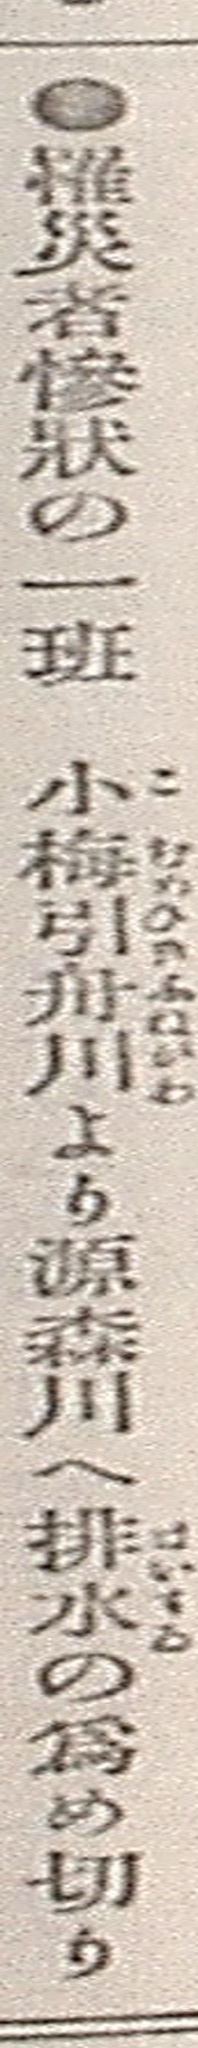●罹災者惨状の一班小梅引舟川より源森川へ排水の為め切り
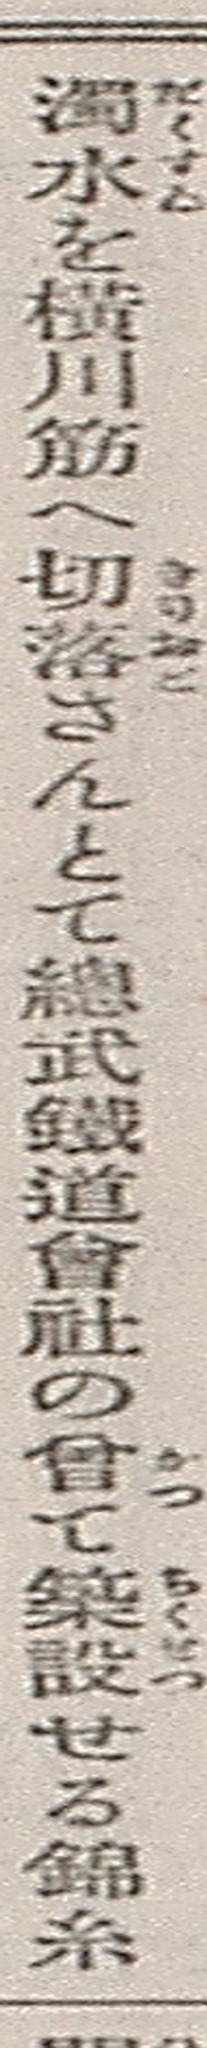濁水を横川筋へ切り落落さんとて総武鉄道会社の曾て築設せる錦糸
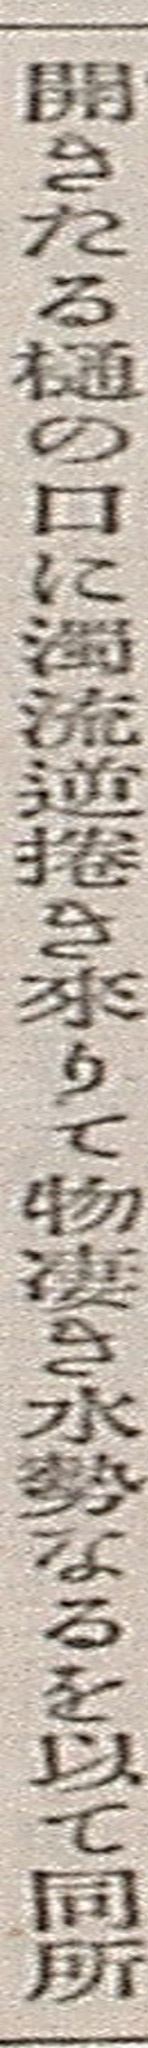開きたる樋の口に濁流逆捲き来りて物凄き水勢なるを以て同所
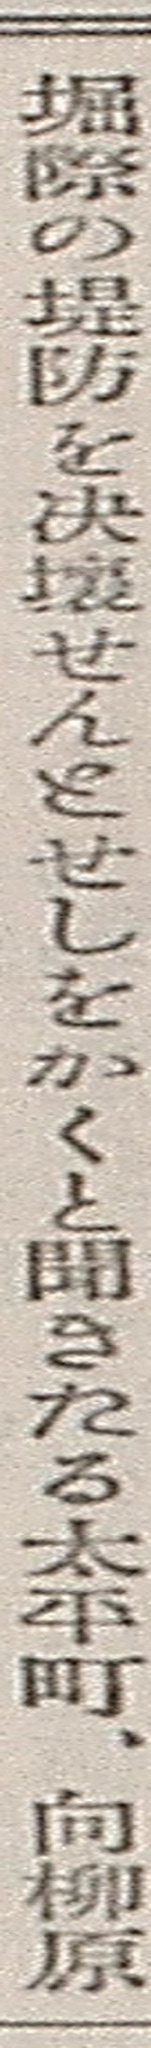堀際の堤防を決壊せんとせしをかくと聞きたる太平町、向柳原
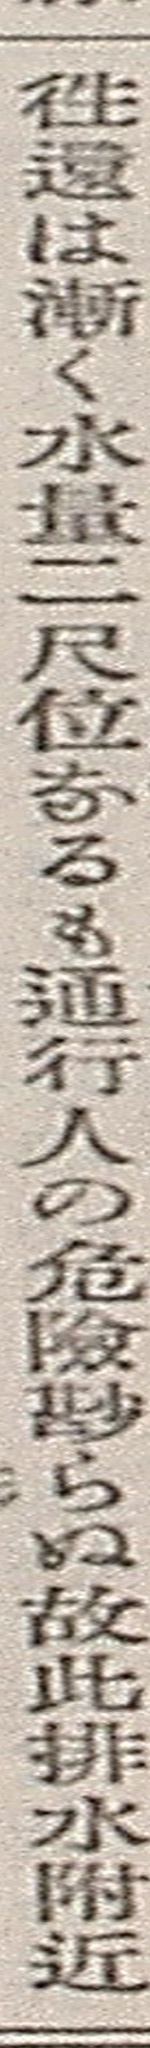往還は漸く水量二尺位なるも通行人の危険少らぬ故此排水附近
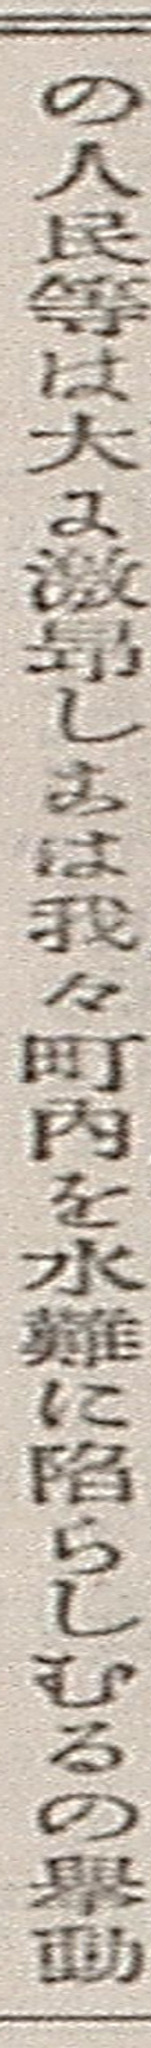の人民等は大に激昂しこは我々町内を水難に陥らしむるの挙動
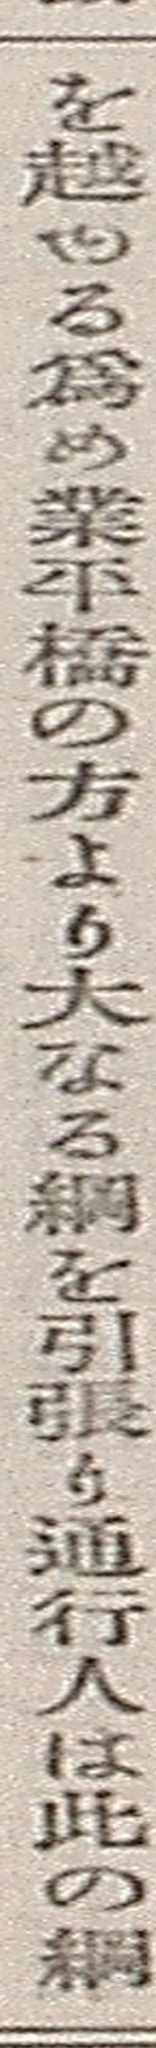を越ゆる為め業平橋の方より大なる綱を引張り通行人は此の綱
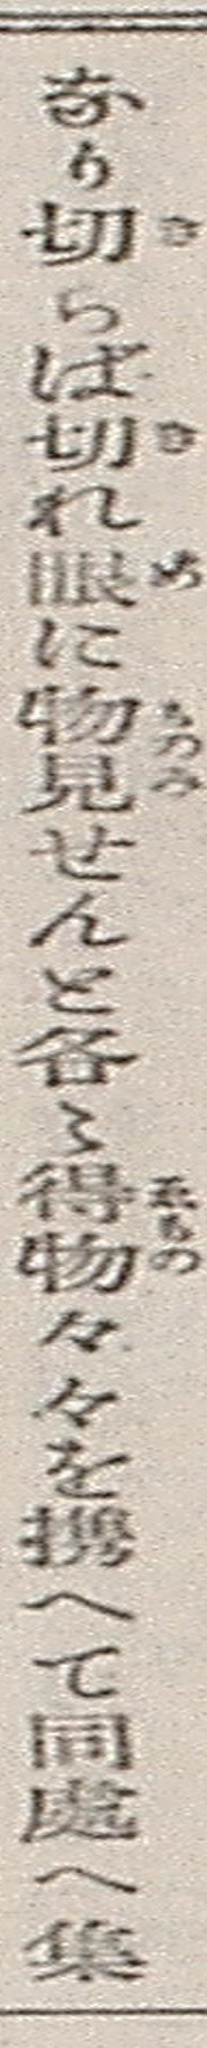なり切らば切れ眼に物見せんと各々得物々々を携へて同処へ集
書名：風俗畫報臨時増刊第百二十四號　洪水地震被害録（上）
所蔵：東京大学地震研究所図書室 Earthquake Research Institute Library, The University of Tokyo, JAPAN
